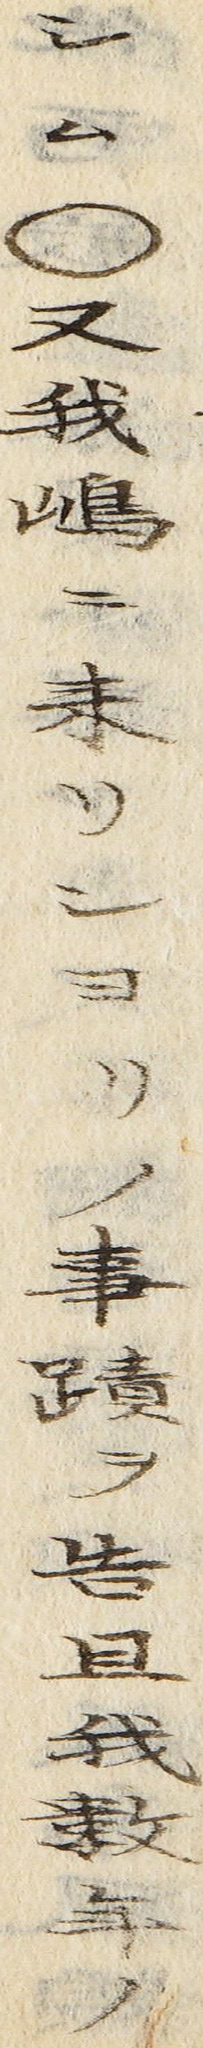シム◯又我嶋ニ来リシヨリノ事蹟ヲ告且我数年ノ
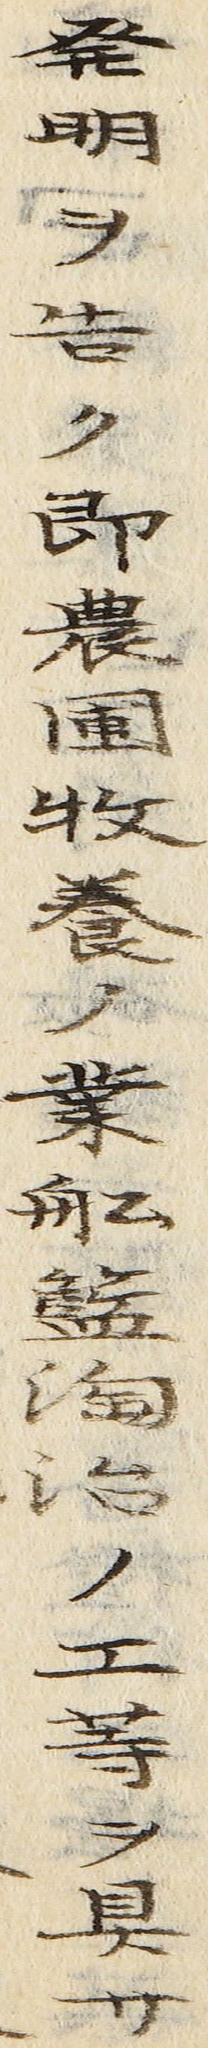発明ヲ告ク即農圃牧養ノ業船籃淘冶ノ工等ヲ具サ
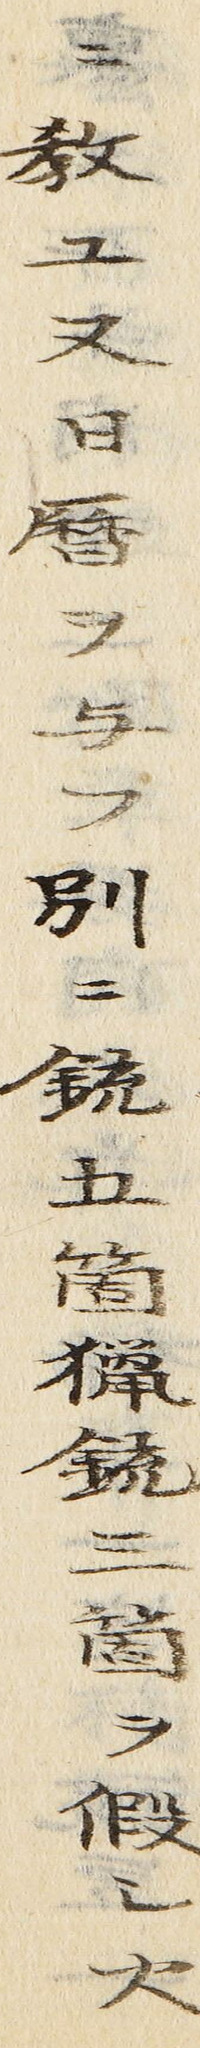ニ教ユ又日暦ヲ与フ別ニ銃五箇猟銃三箇ヲ仮シ火
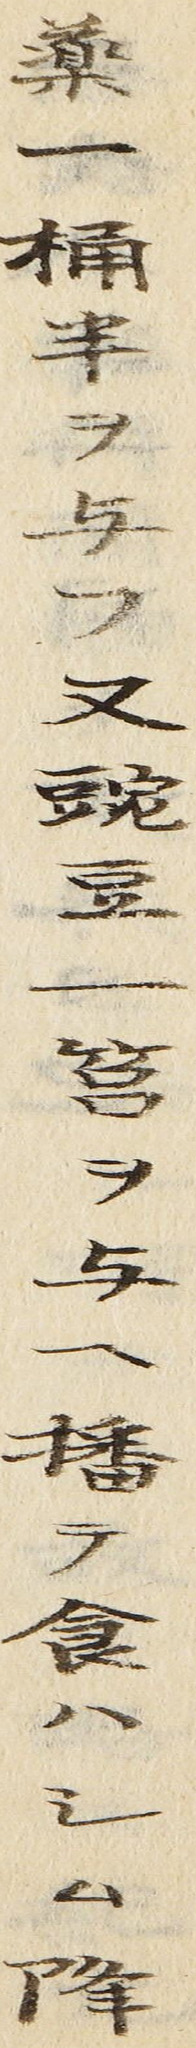薬一桶半ヲ与フ又豌豆一筥ヲ与ヘ播テ食ハシム降
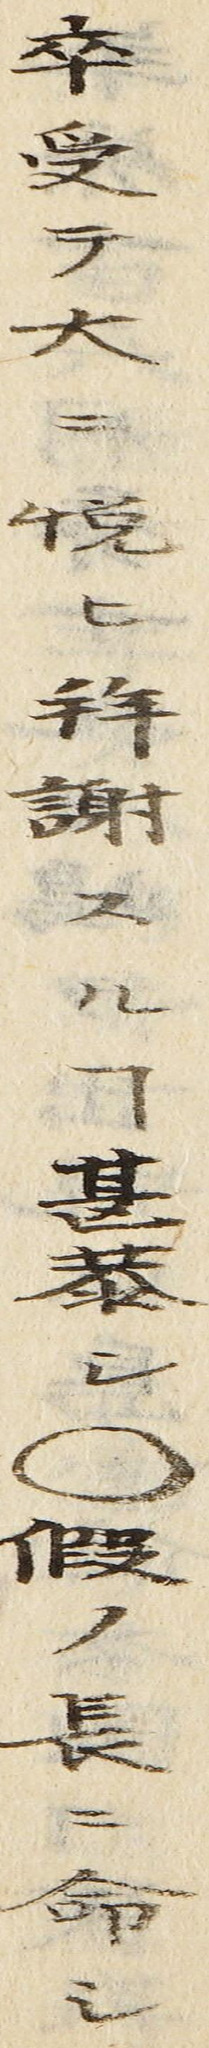卒受テ大ニ悦ヒ拝謝スルコト甚恭シ◯仮ノ長ニ命シ
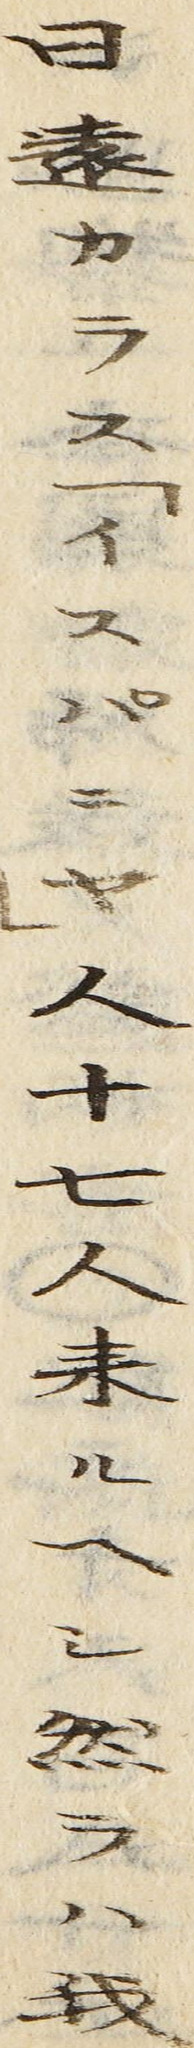曰遠カラス「イスパニヤ」人十七人来ルヘシ然ラハ我
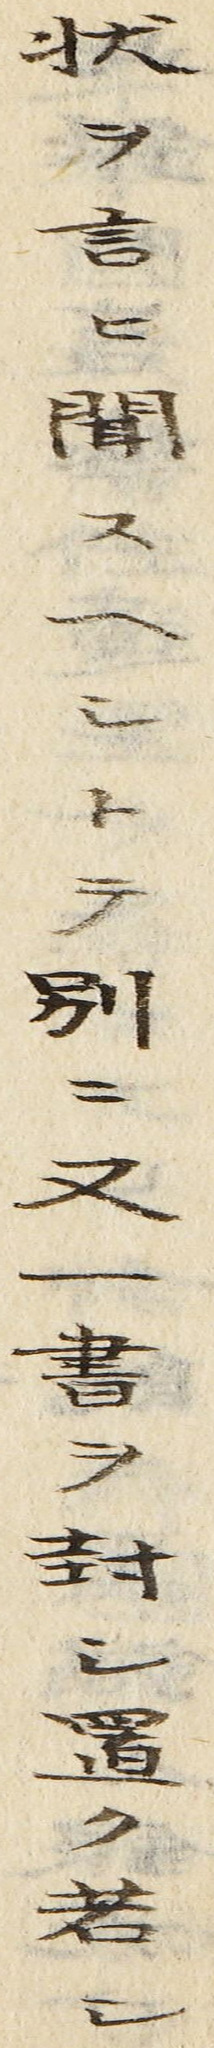状ヲ言ヒ聞スヘシトテ別ニ又一書ヲ封シ置ク若シ
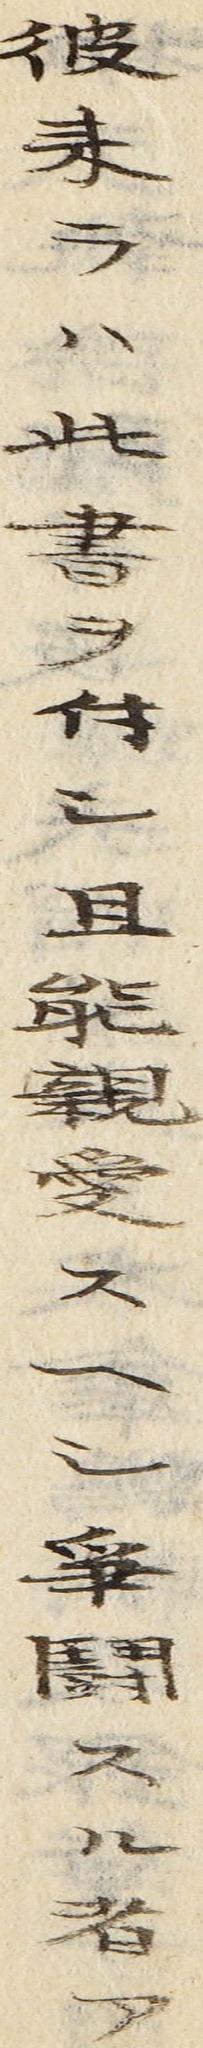彼来ラハ此書を付シ且能親愛スヘシ争闘スル者ア
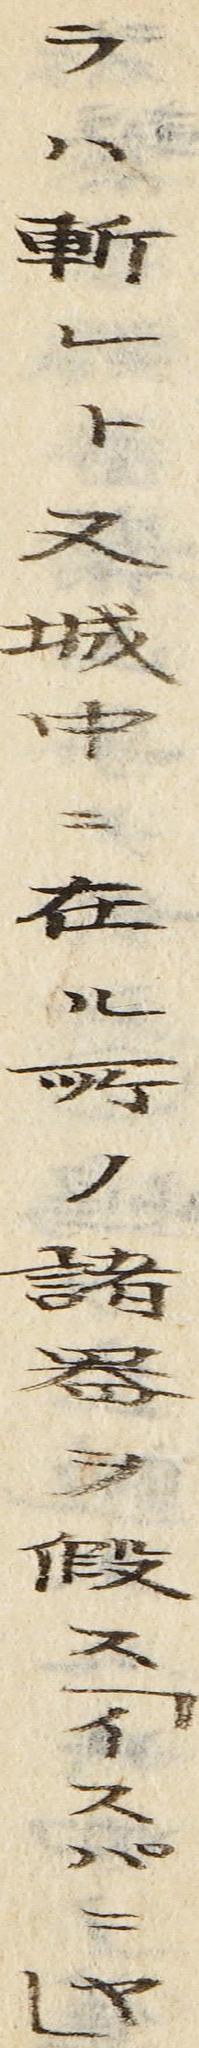ラハ斬レト又城中ニ在ル所ノ諸器ヲ仮ス「イスパニヤ」
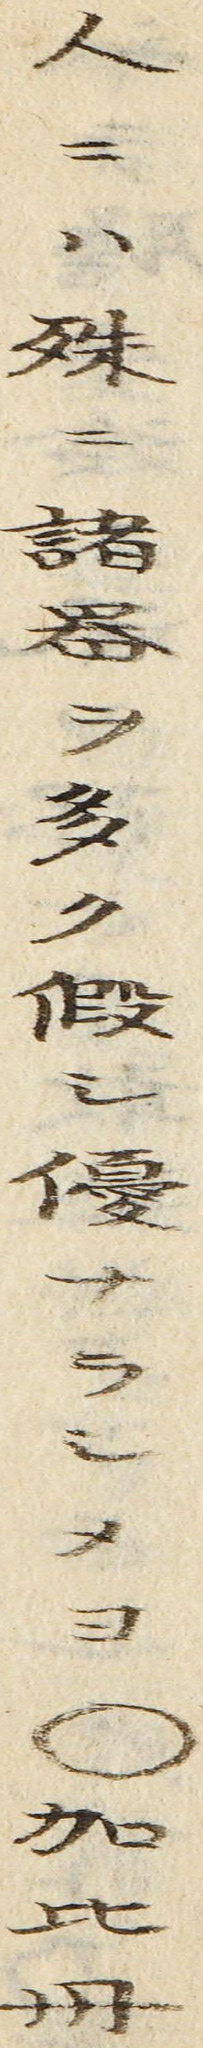人ニハ殊ニ諸器ヲ多ク仮シ優ナラシメヨ◯加比丹
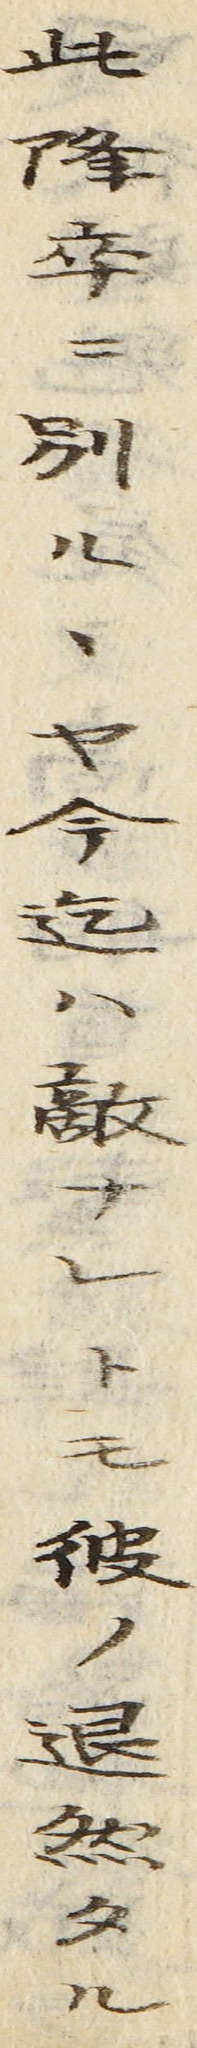此降卒ニ別ルヽヤ今迄ハ敵ナレトモ彼ノ退然タル
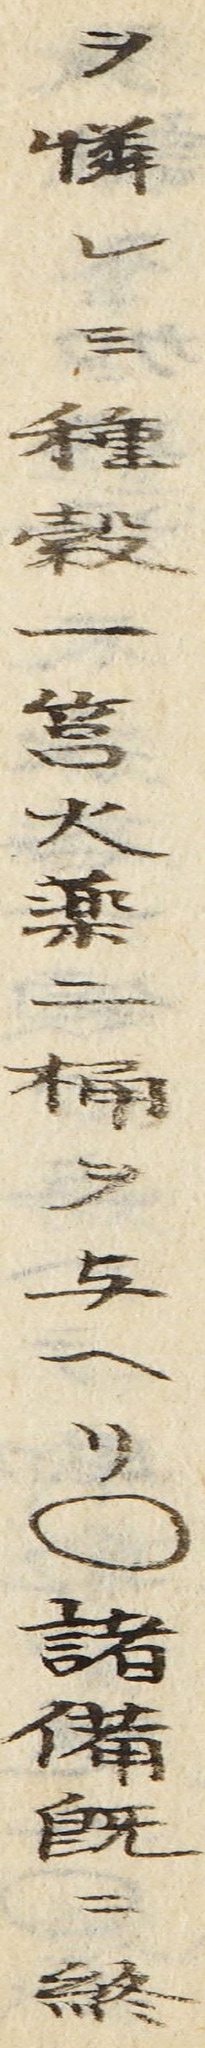ヲ憐レミ種穀一筥火薬二桶ヲ与ヘリ◯諸備既ニ終
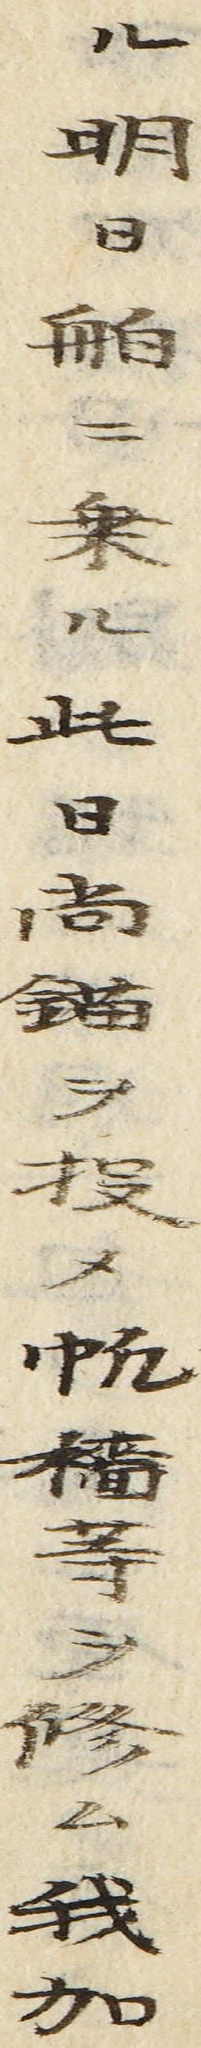ル明日舶ニ乗ル此日尚錨ヲ投シテ帆檣等ヲ修ム我加
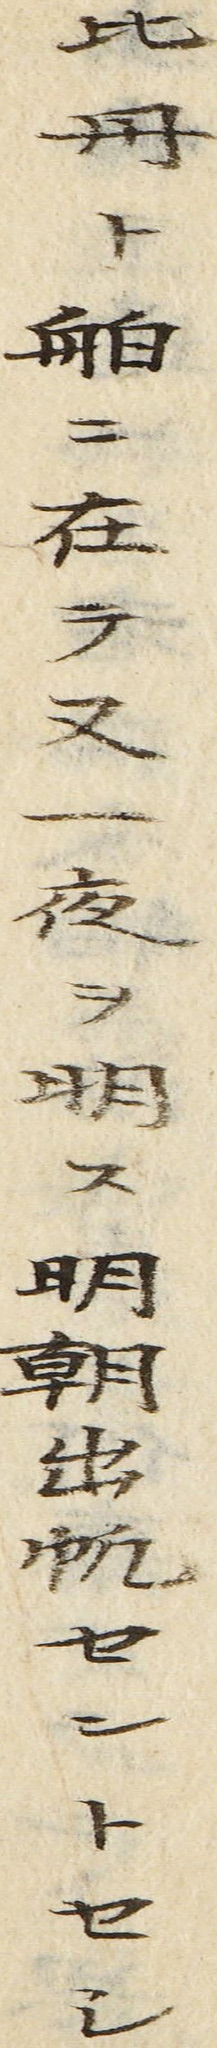比丹ト舶ニ在テ又一夜ヲ明ス明朝出帆セントセシ

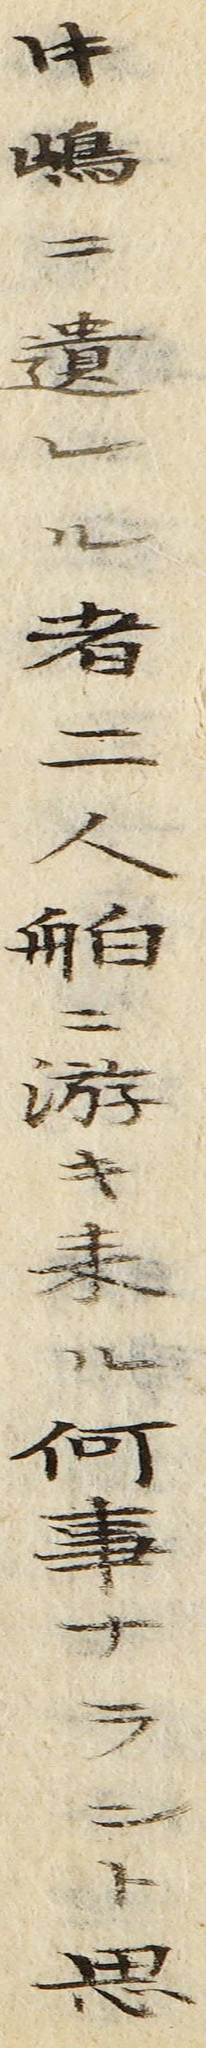トキ嶋ニ遺レル者二人舶ニ游キ来ル何事ナラント思
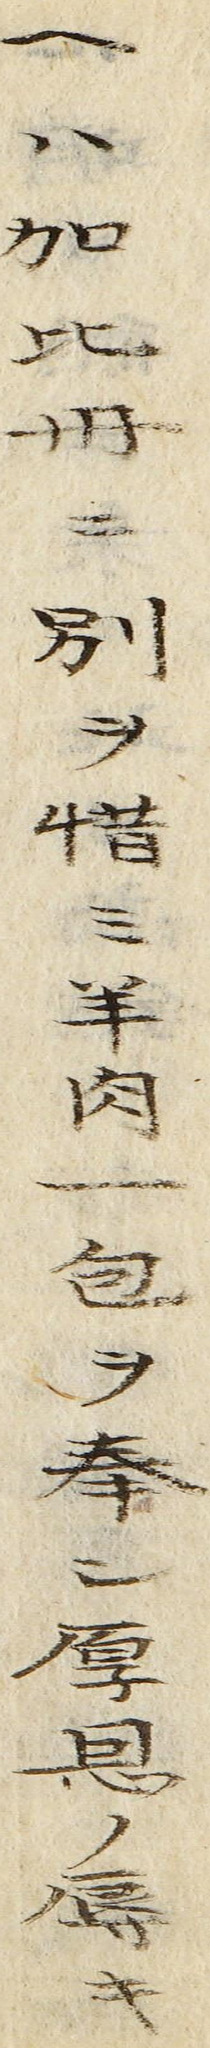ヘハ加比丹ニ別ヲ惜ミ羊肉一包ヲ奉ン厚恩ノ辱キ
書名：漂流紀事
